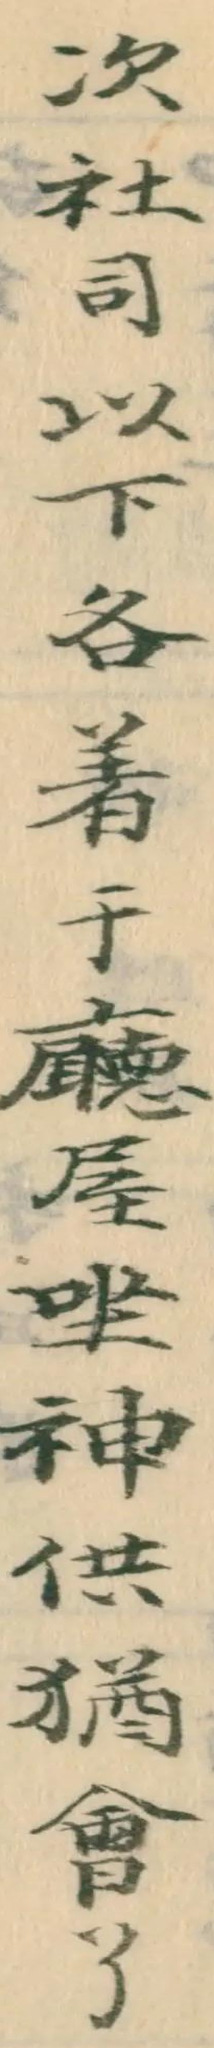次社司以下各着于庁屋坐神供猶会了
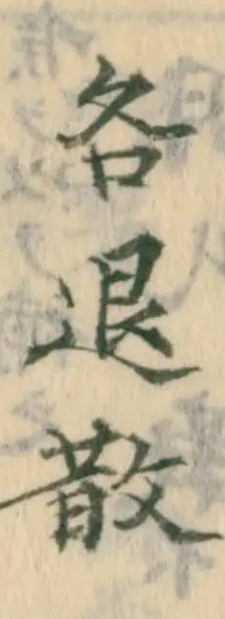各退散
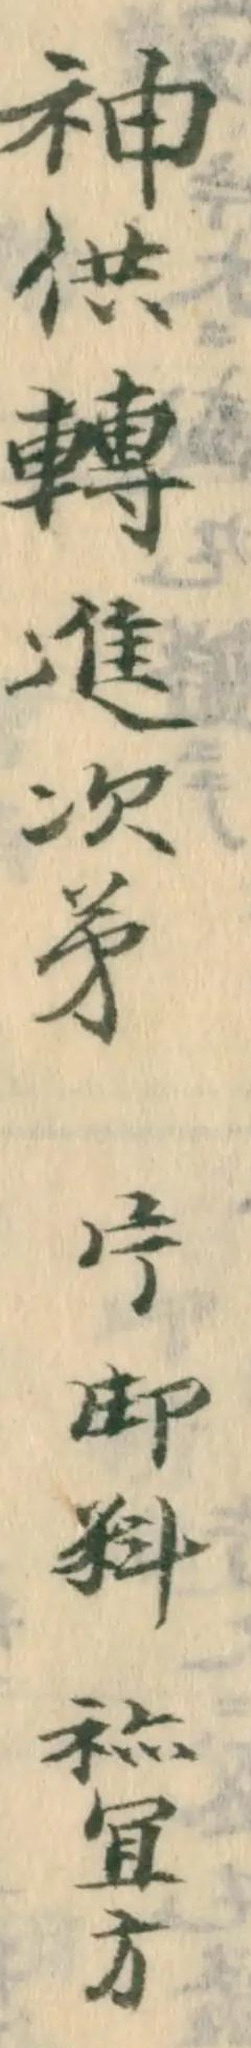神供転進次第片御料禰宜方

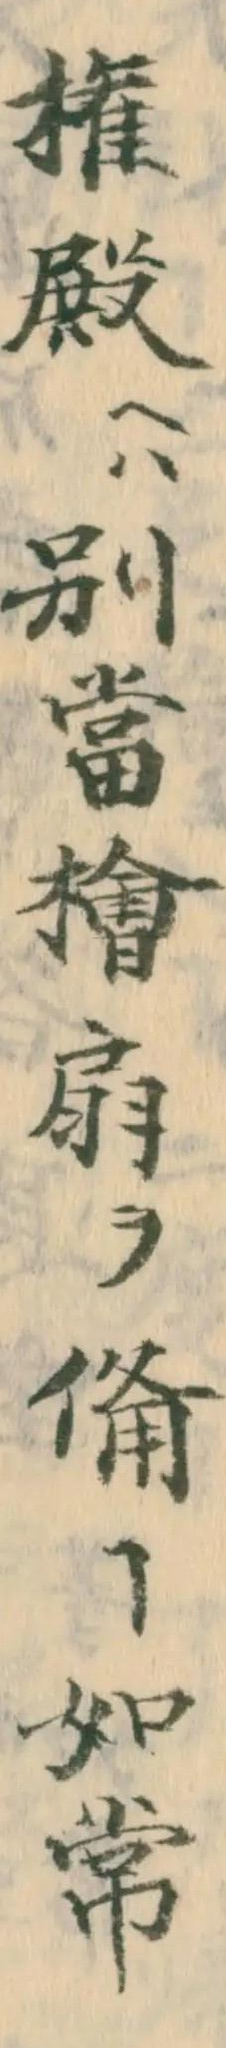権殿ヘハ別当檜扇ヲ備コト如常
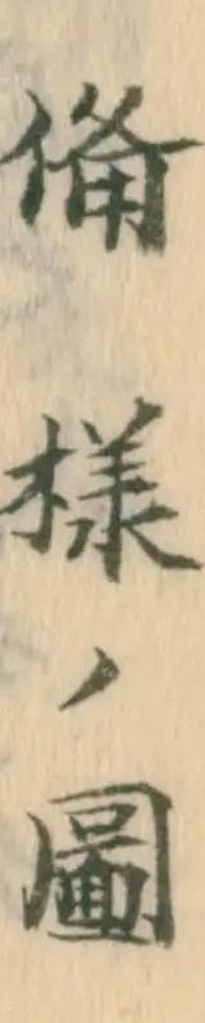備様ノ図
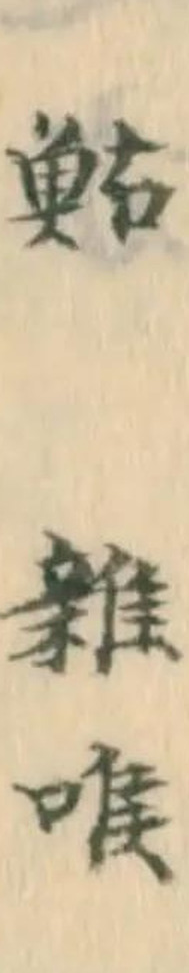鮎雑喉
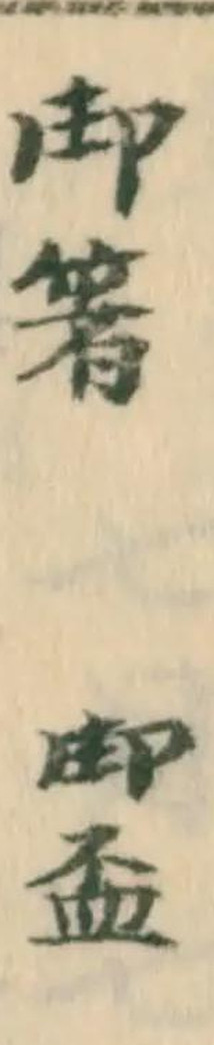御箸御盃
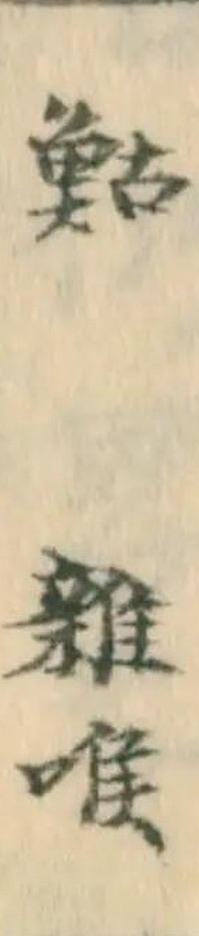鮎雑喉

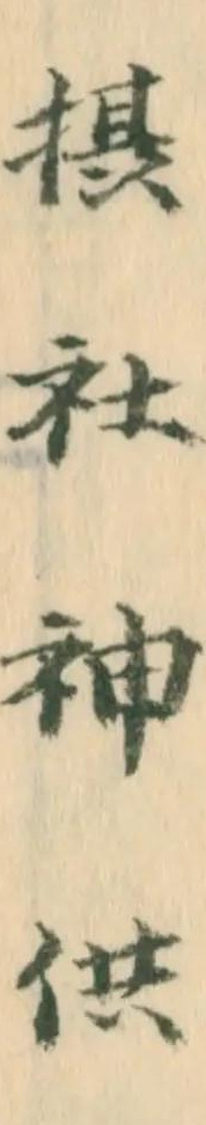摂社神社
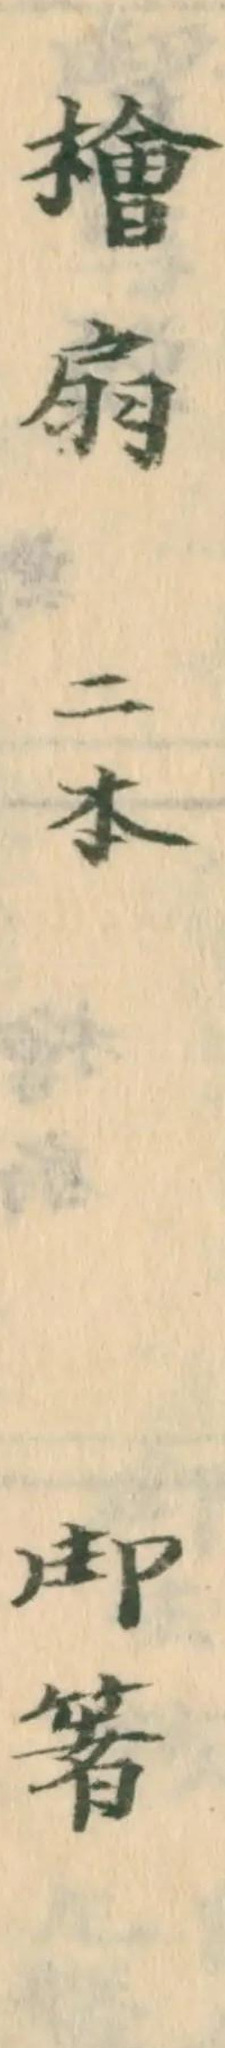檜扇二本御箸一
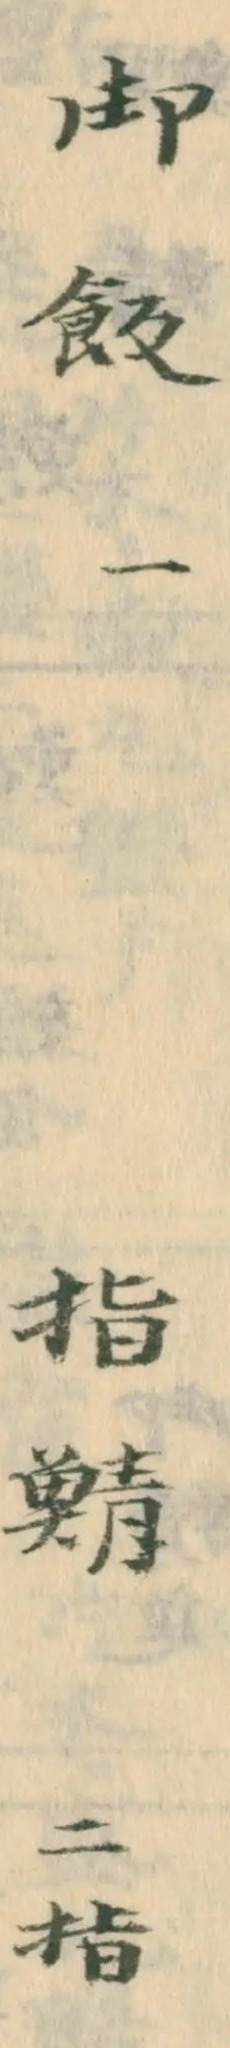御飯一指鯖二指
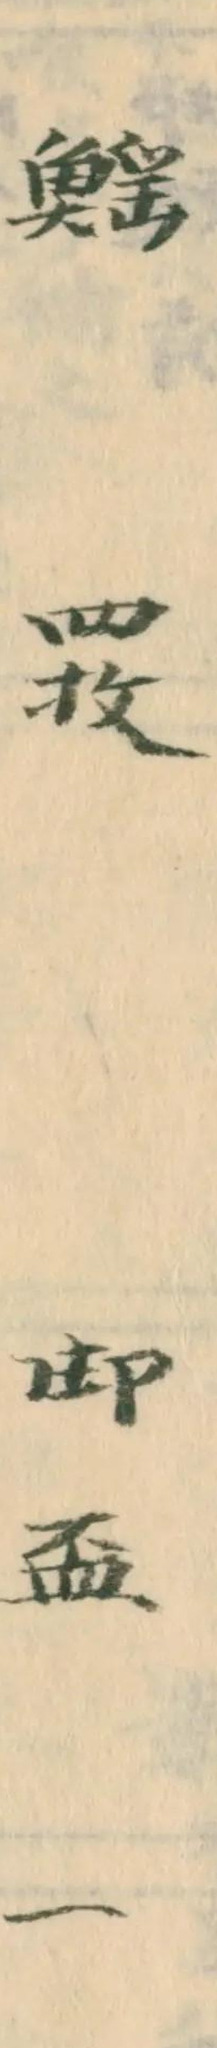鰩四枚御盃一
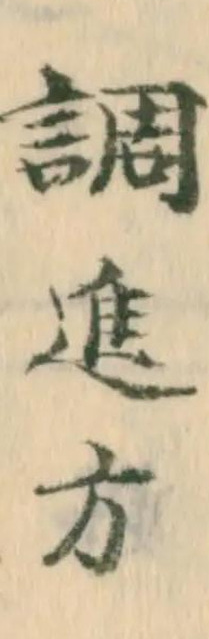調進方
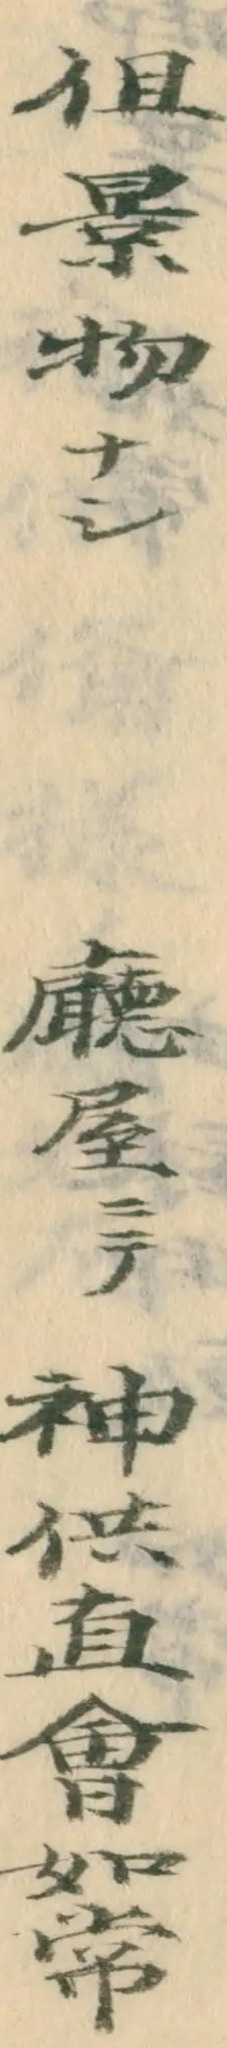但景物ナシ庁屋ニテ神供直会如常
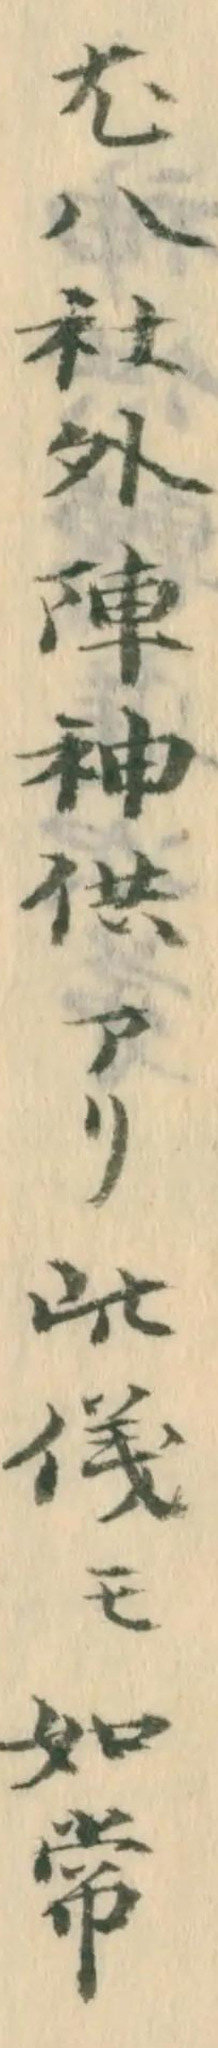尤八社外陣神供アリ此儀モ如常

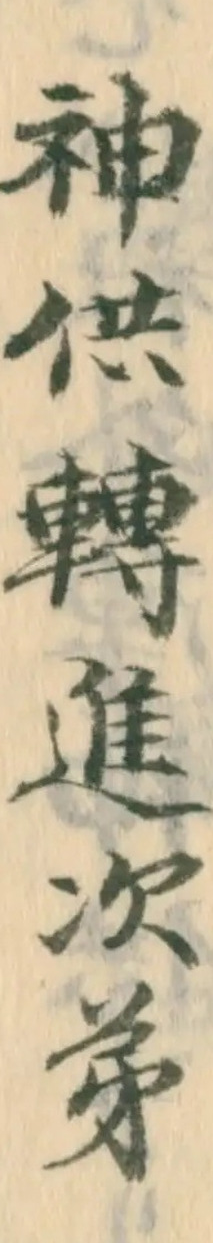神供転進次第
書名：賀茂社記録. 第5冊
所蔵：国立国会図書館 National Diet Library, JAPAN
